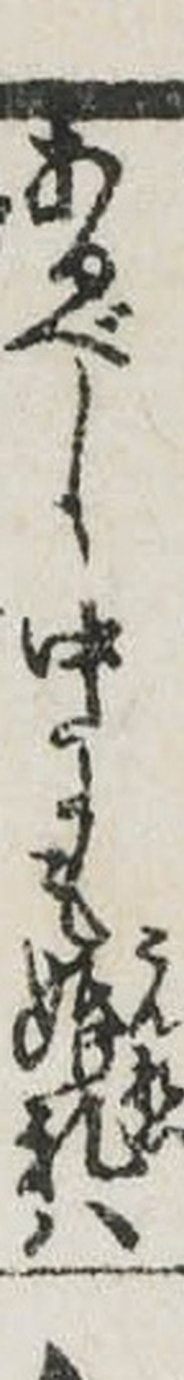あるべし中にも婚礼は
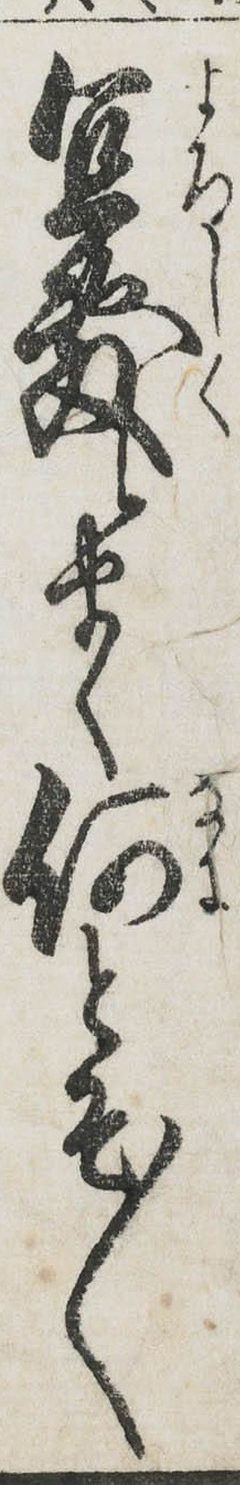宜敷候まゝ何とそ〳〵
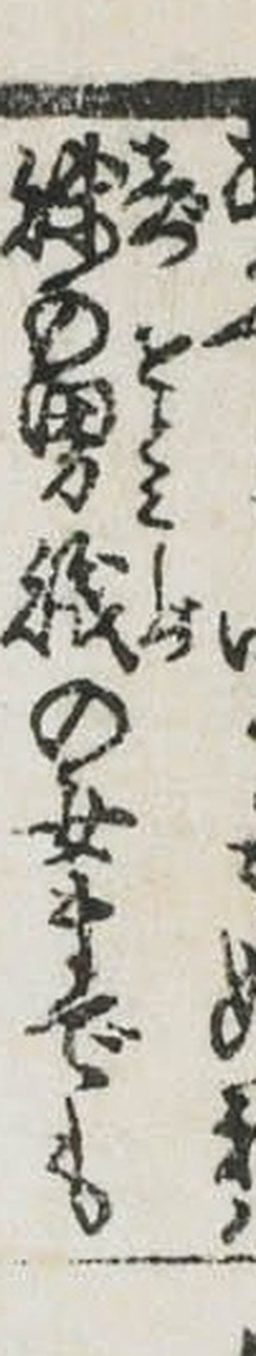賤の男賤の女までも
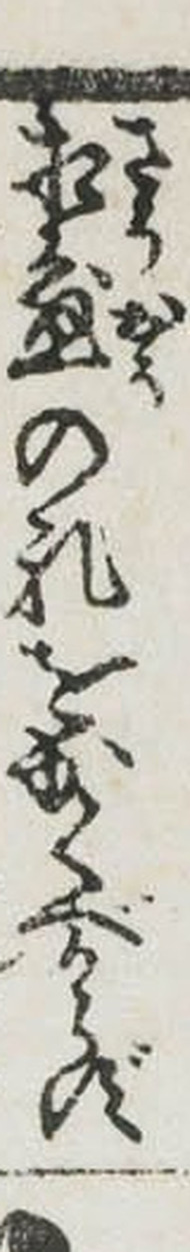相応の礼をかくべからず
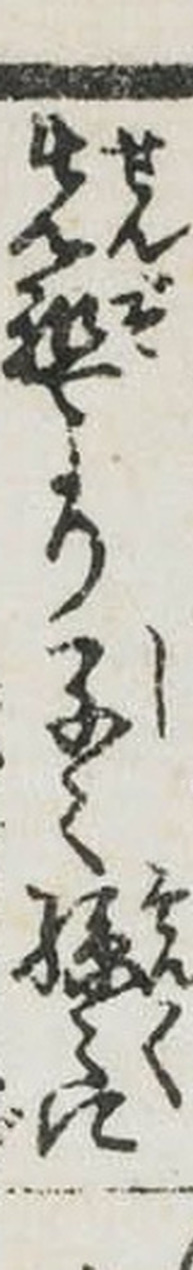先祖より子々孫々に
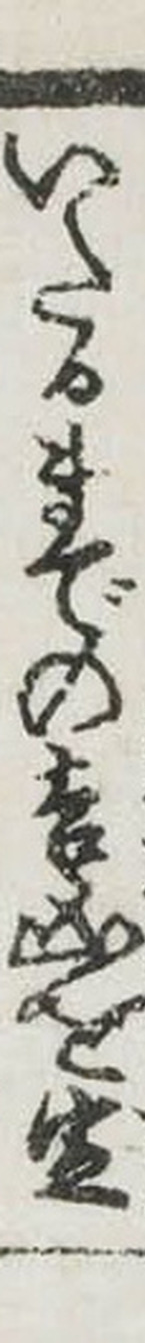いたるまでの吉凶を定
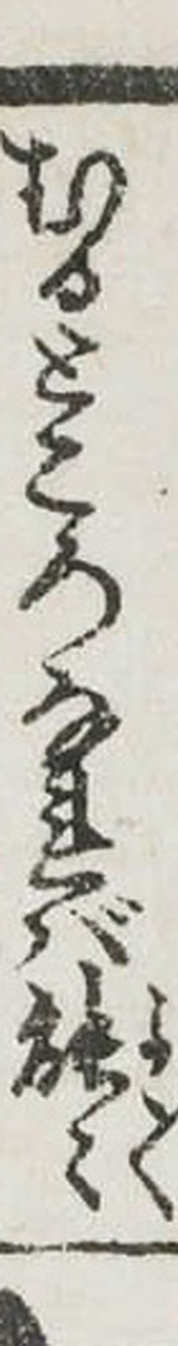むるところなれば能々
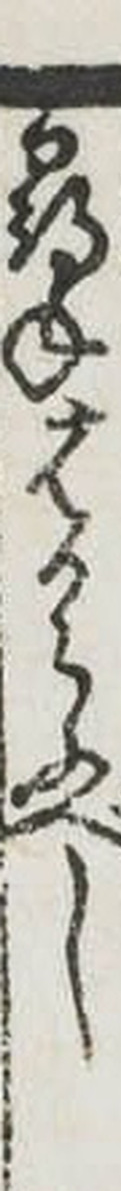尋ねはからふべし
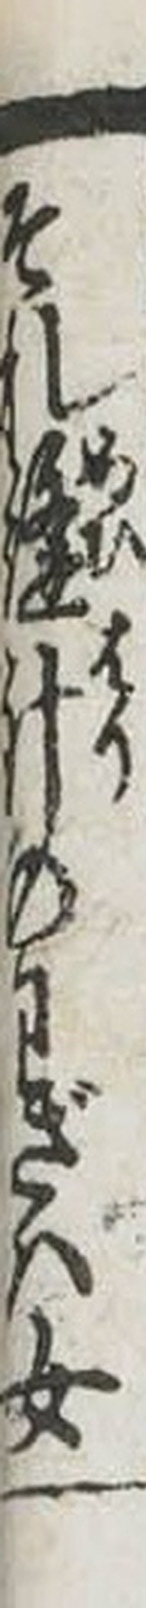それ縫針のわざは女
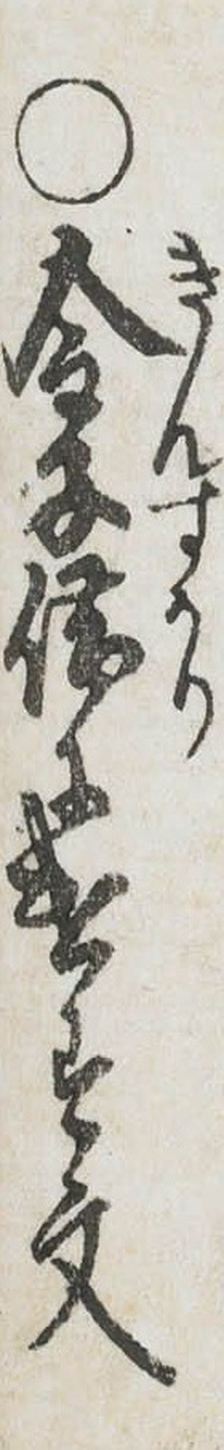○金子借に遣す文
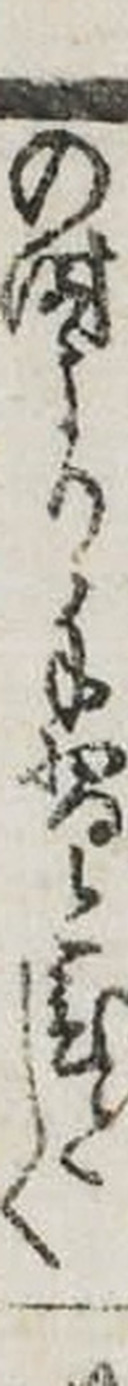の時より手習とひとしく
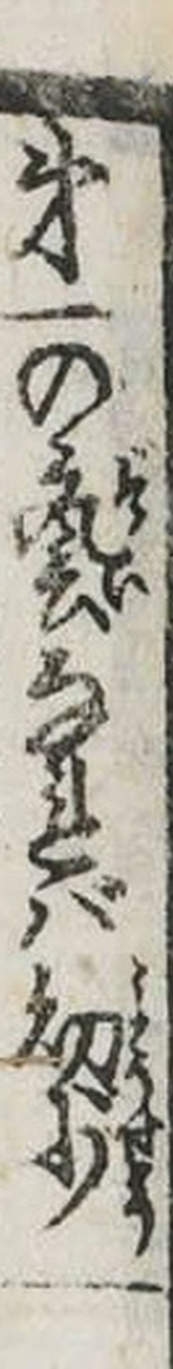第一の芸なれば幼少
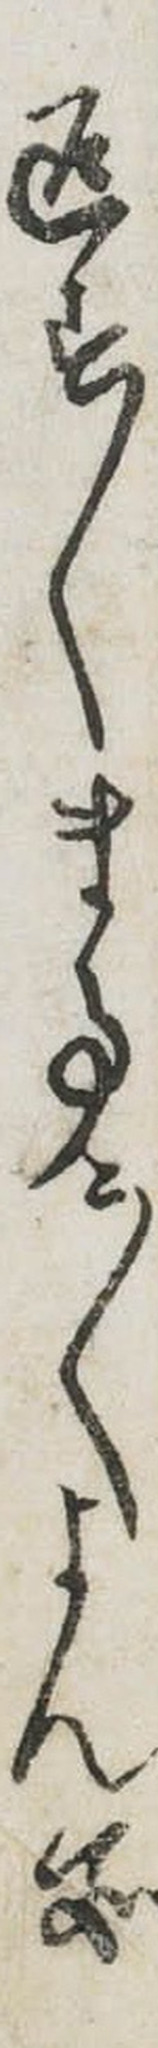返す〳〵ま事に〳〵よん処
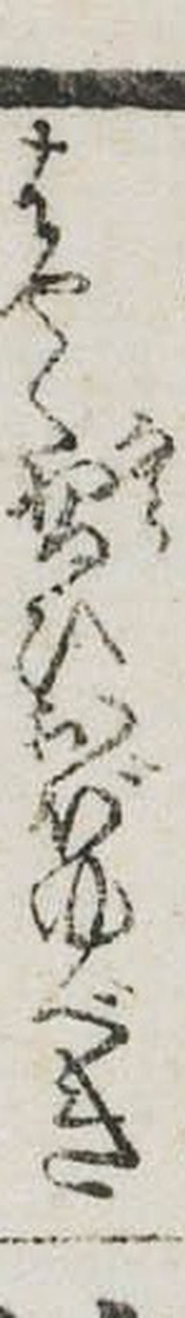はやく習ひおぼゆべき
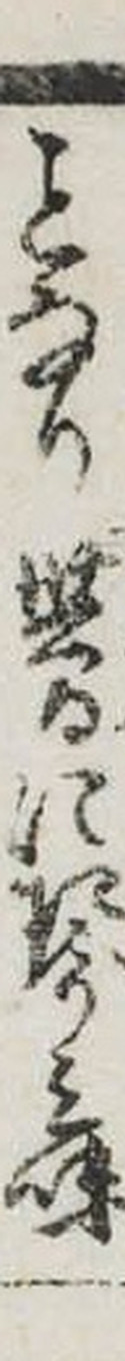ことなり世間に琴三味
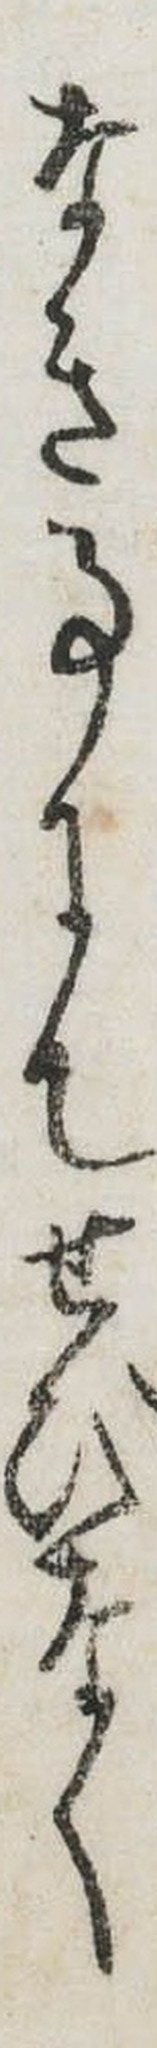なき事にてせひなく
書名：頭書萬用婦人手紙之文言
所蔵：東京学芸大学教育コンテンツアーカイブ
